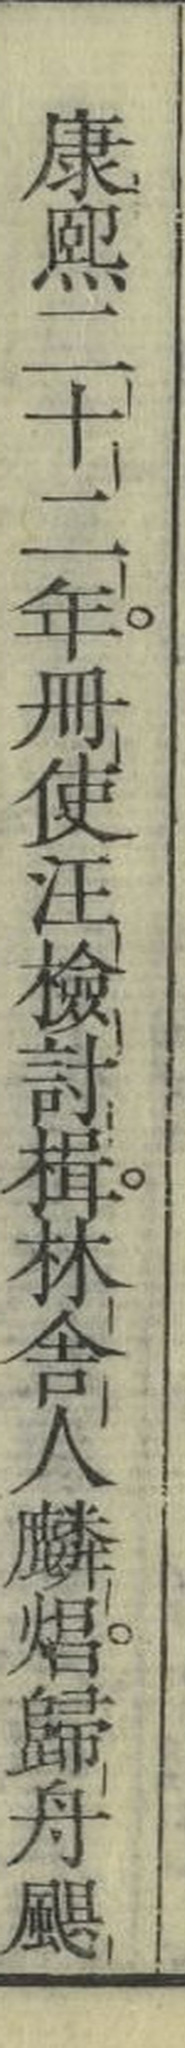康-熙二-十-二-年。冊-使汪-檢-討-楫。林-舎-人麟-焻。歸-舟颶-
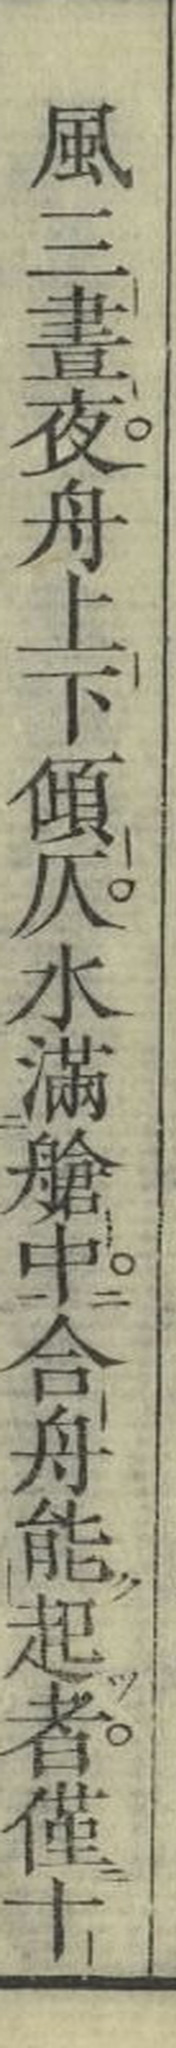風三-晝-夜。舟上-下傾-仄。水滿艙-中。合-舟能-起者。僅十-

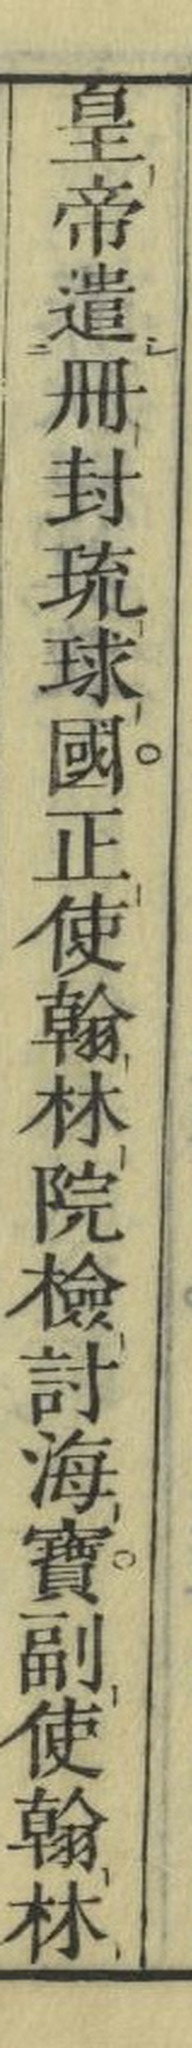皇-帝遣冊封琉-球-國。正-使翰-林-院檢-討海-寶。副-使翰-林-
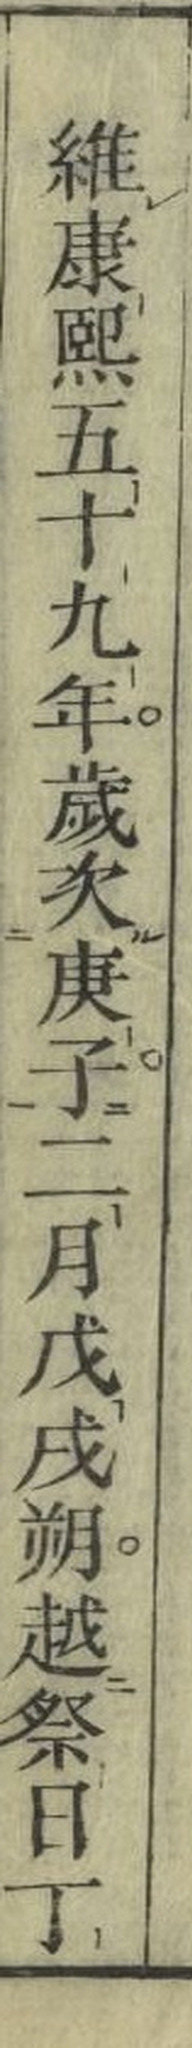維康-熙五-十-九-年。歲次庚-子。二-月戊-戌朔。越祭-日丁-

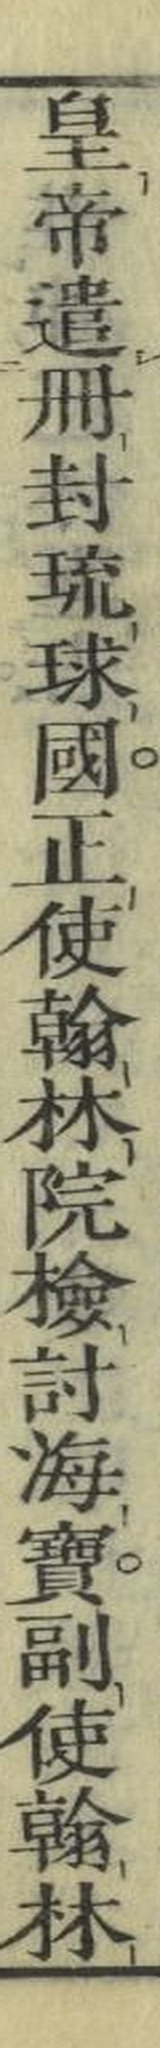皇-帝遣冊-封琉-球-國。正-使翰-林-院檢-討海-寶。副-使翰-林-
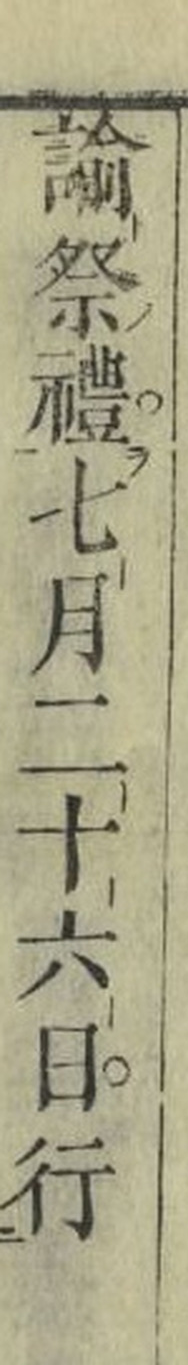諭-祭禮。七-月二-十-六-日。行

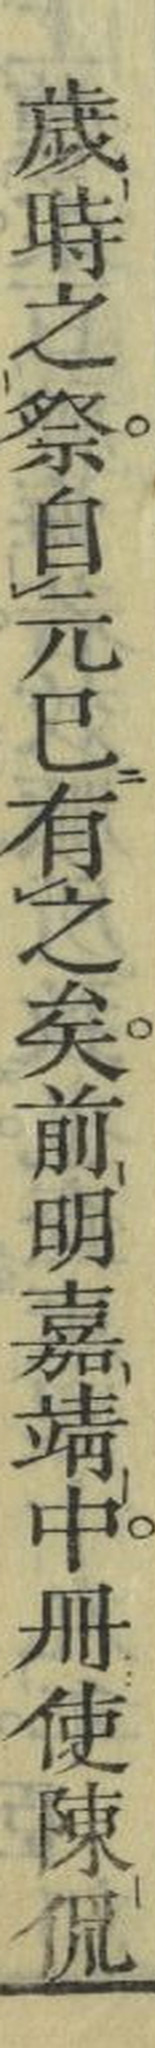歲-時之-祭。自元巳有之矣。前-明嘉-靖-中。冊-使陳-侃

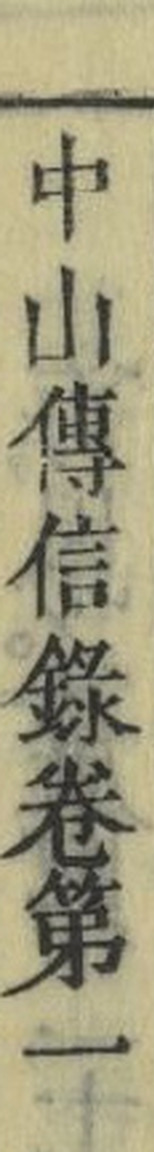中山傳信錄卷第一
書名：中山伝信録 巻一
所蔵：University of the Ryukyus Library
